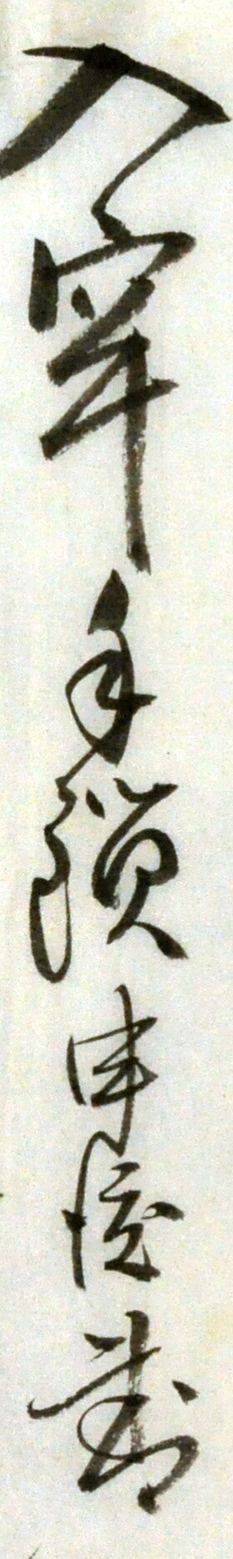入牢手鎖申渡書
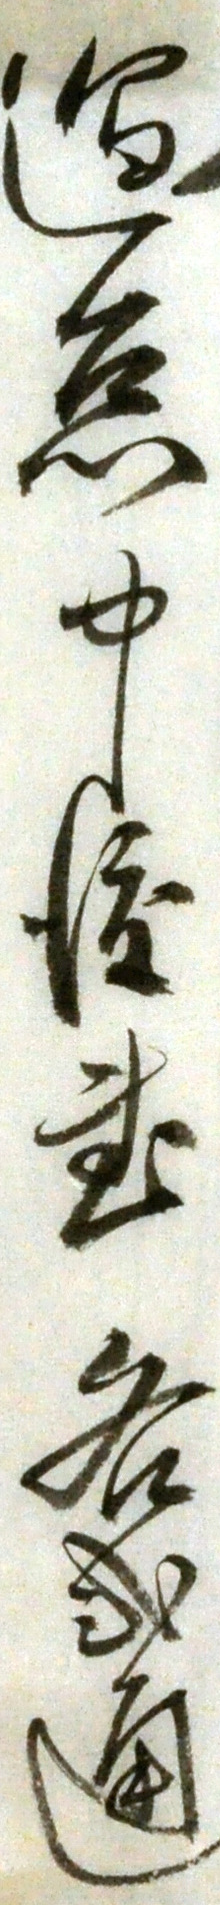過怠申渡書各弐通

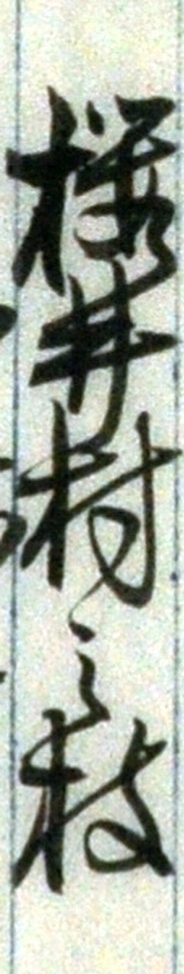桜井村之枝
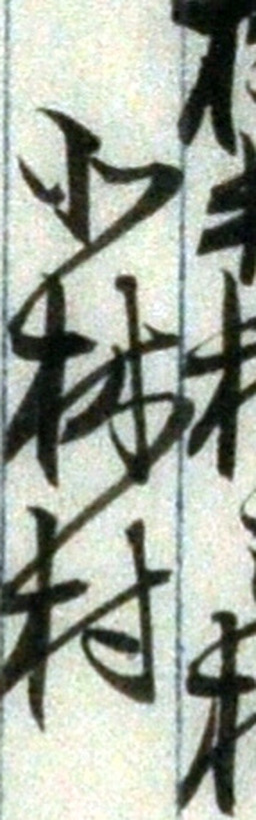北林村
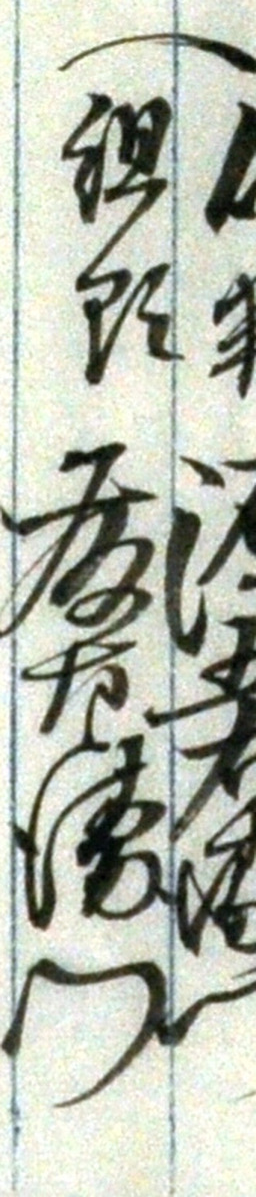組頭藤左衛門
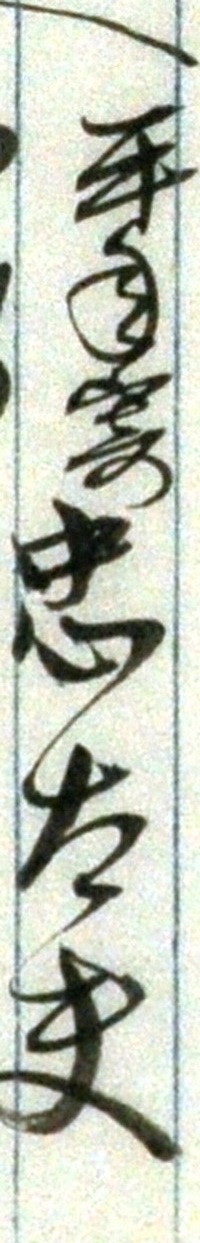平年寄忠太夫
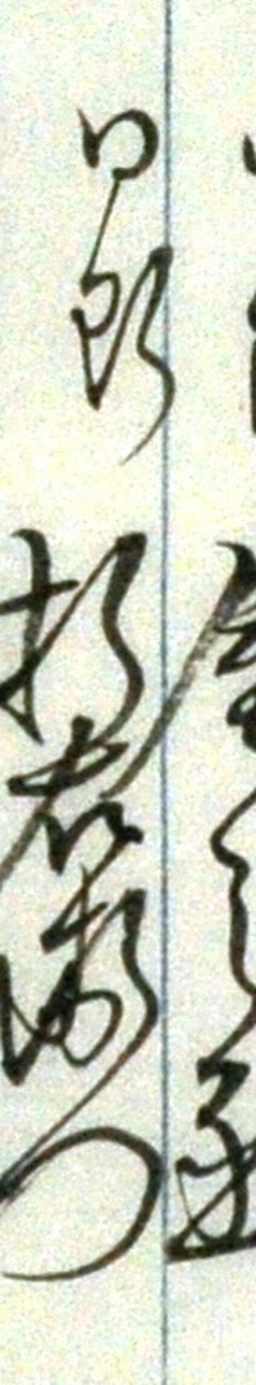同断折右衛門
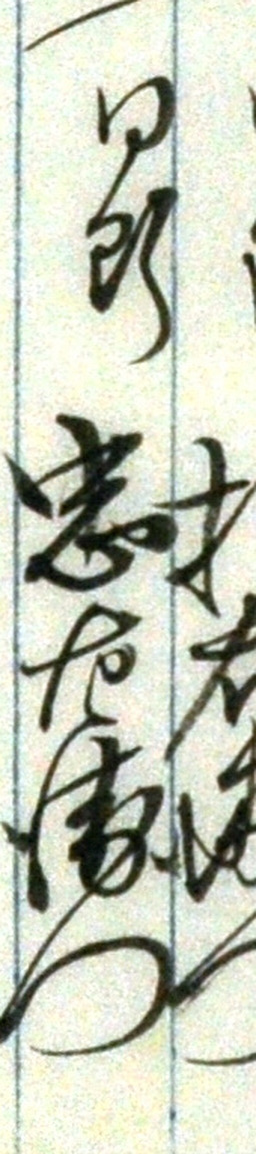同断折右衛門
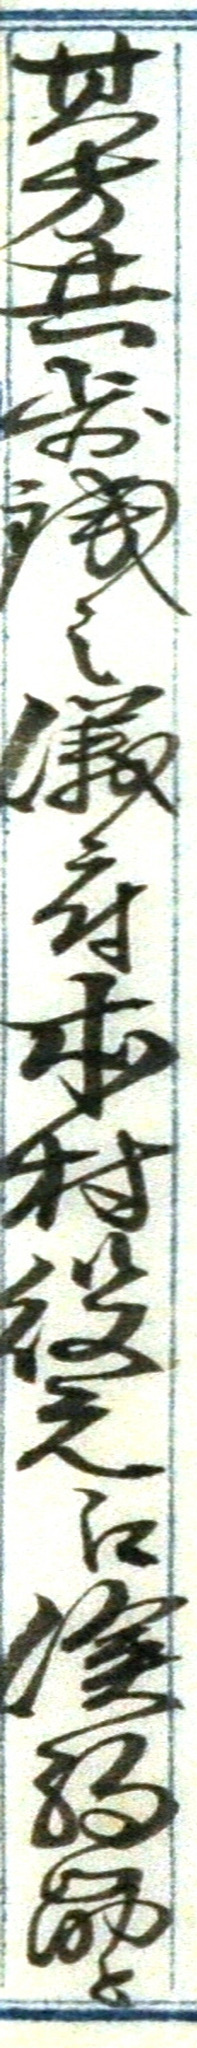其方共歩銭之儀ニ付本村役元江倹約筋と

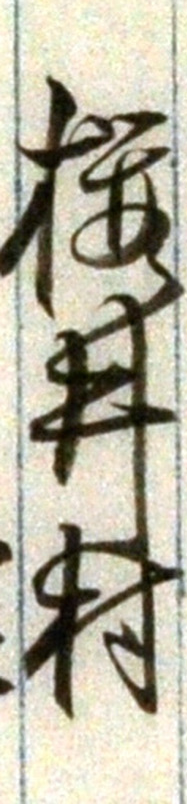桜井村
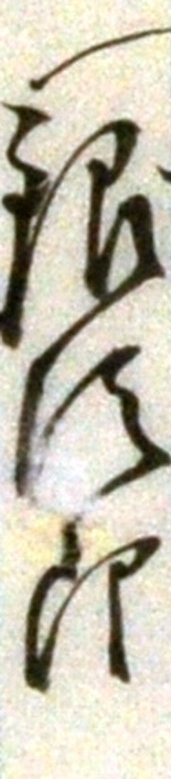銀次郎
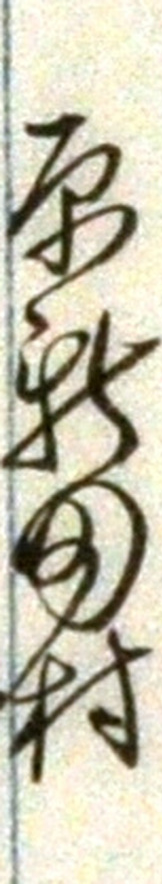原新田村

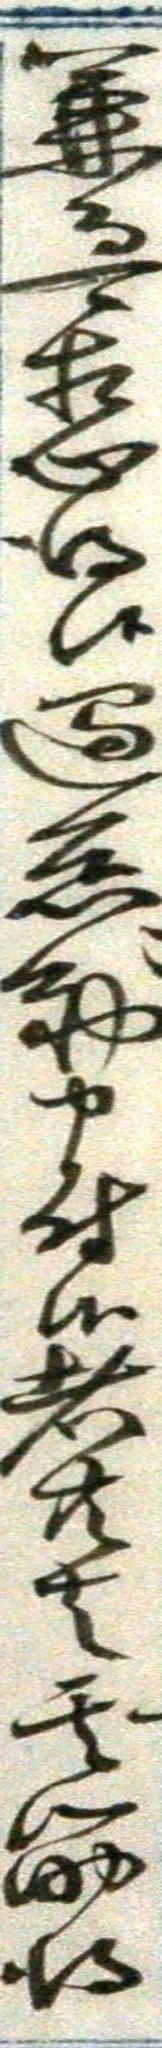兼而可相心得候過怠勤申付候者共は其筋得
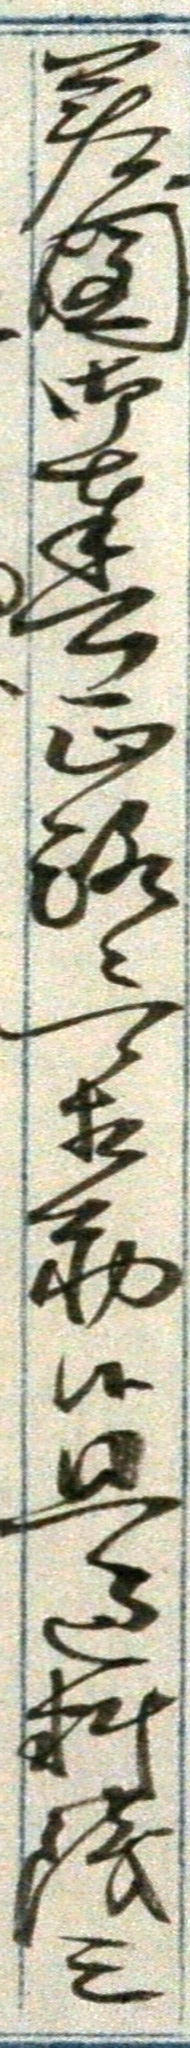差図御奉公正路ニ可相勤候且過料銭三
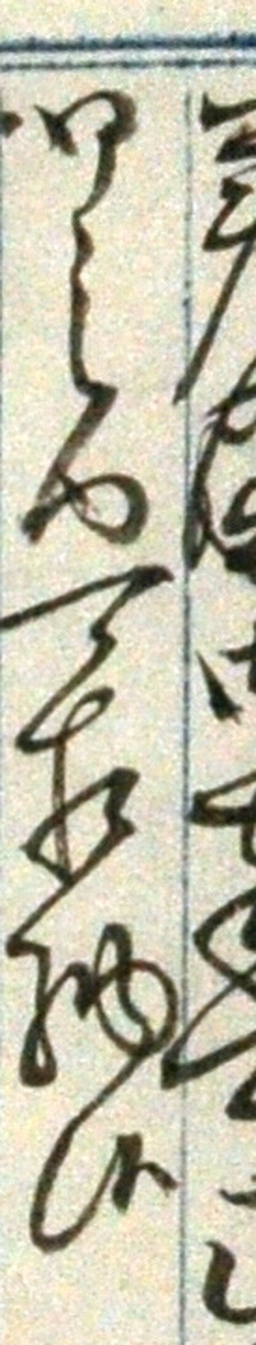日之内可相納候
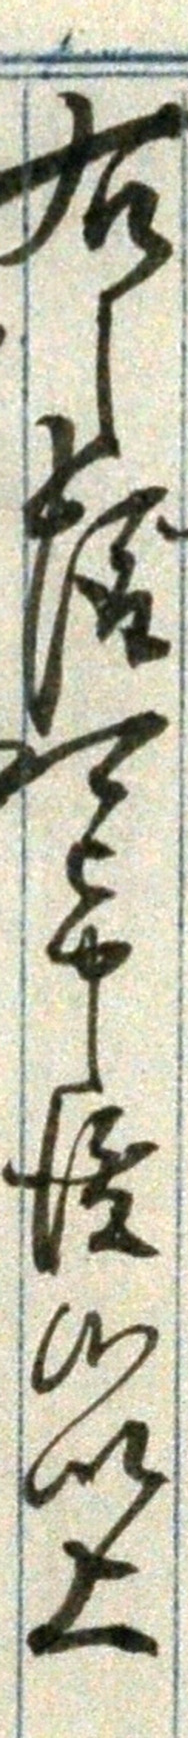右之趣可被申渡候以上
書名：入牢手鎖申渡書・過怠金申渡書
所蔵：伊那市立高遠町図書館・合同会社AMANE
